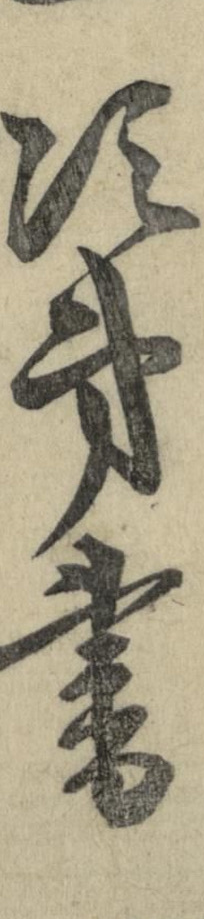次第書
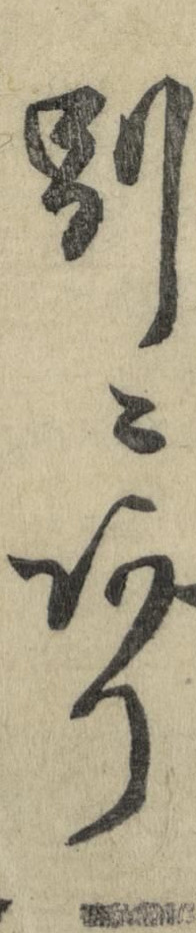別にあり
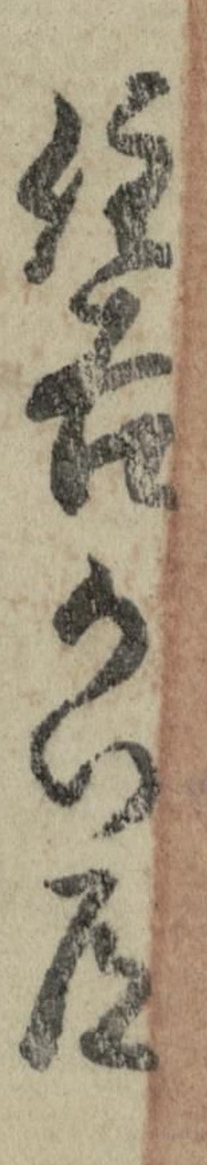住吉かい道
